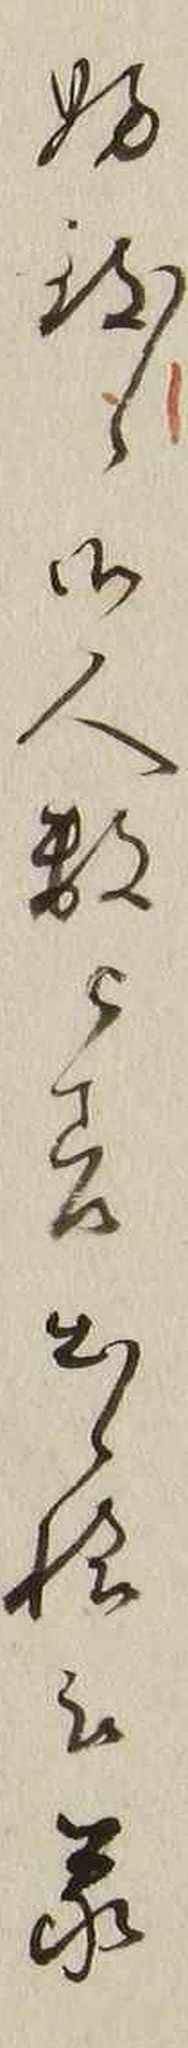妨致し御人数被差出候様被蒙
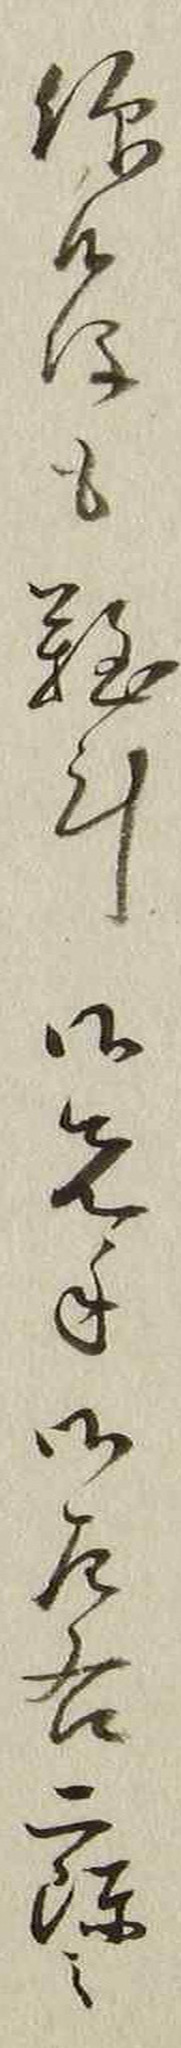仰候儀も難計御先手御左右二陣之
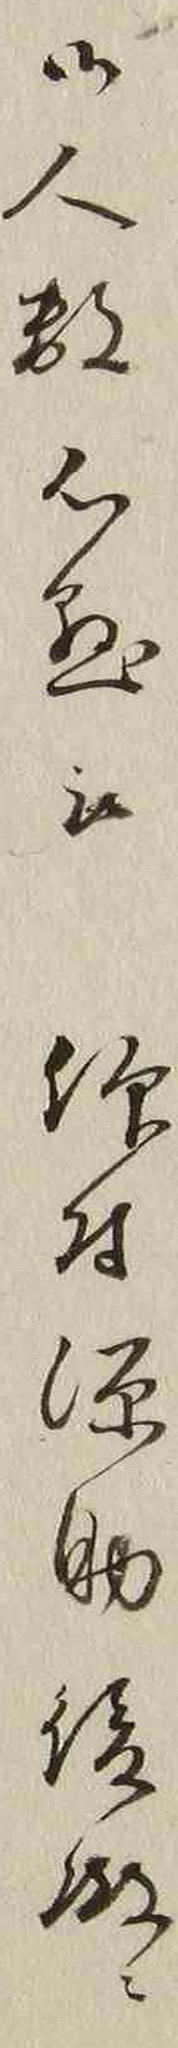御人数心懸被仰付源助後殿に
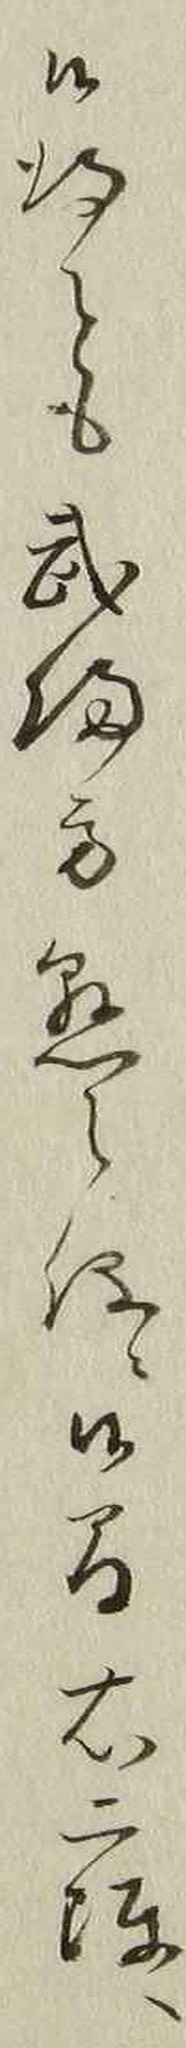候得とも武備方懸之儀に候間右二陣へ
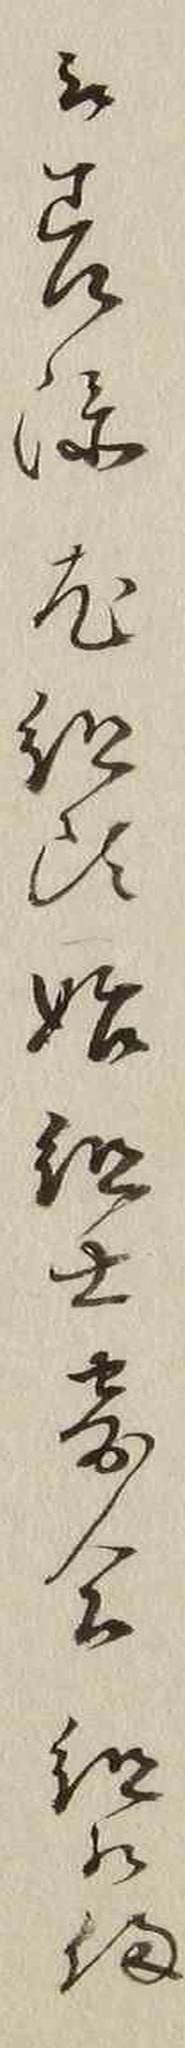被差添尤組頭始組士寄合組御備
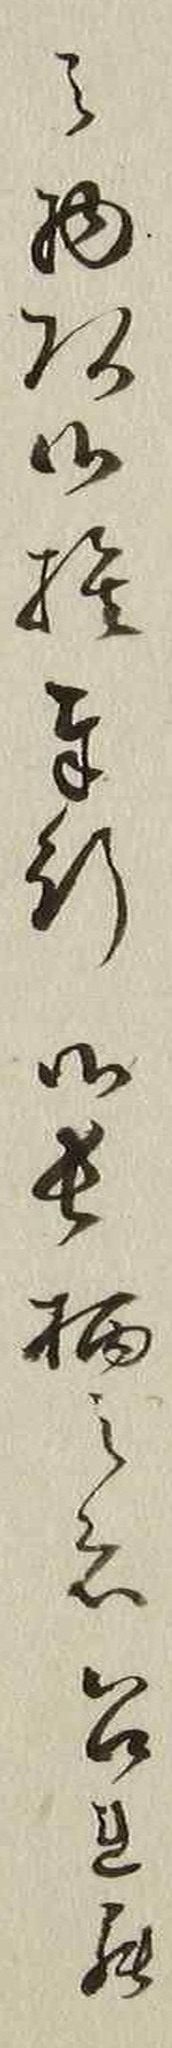之物頭御旗奉行御長柄之者召蓮罷
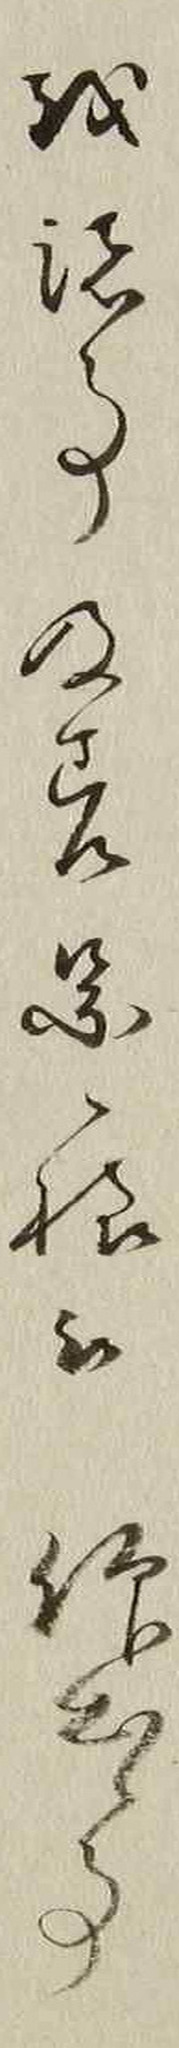越諸事及指図候様被仰出候事
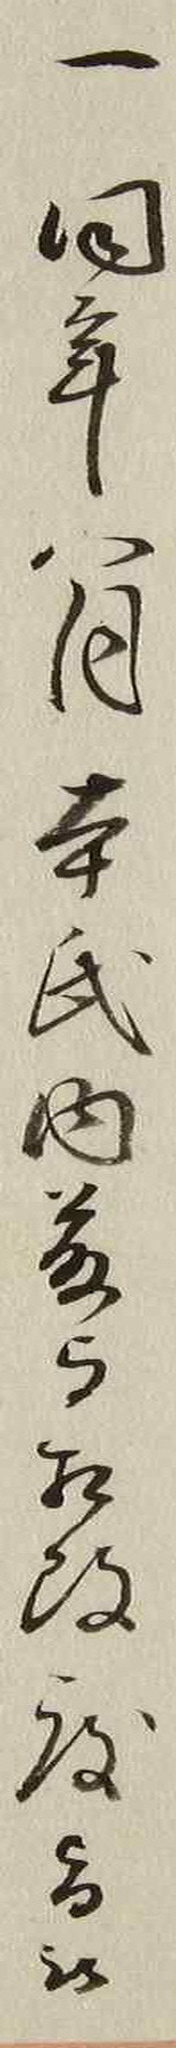一同年八月本氏内藤と相改度旨被
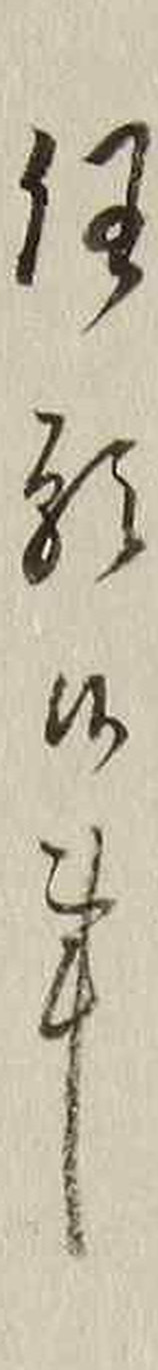任願候事
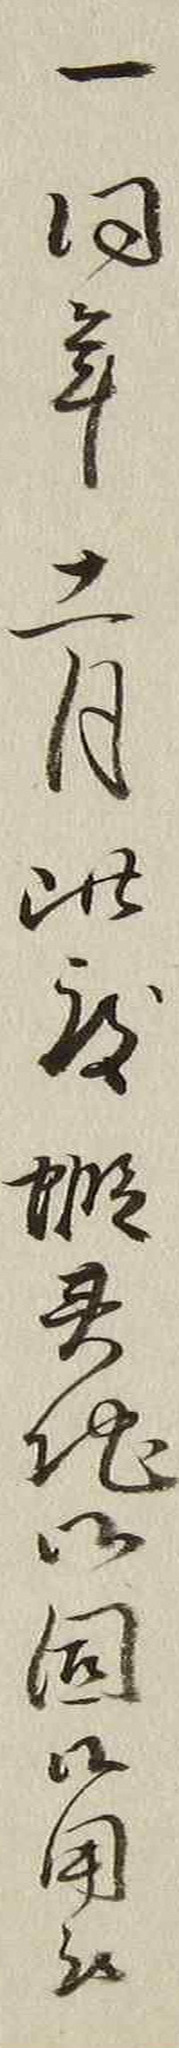一同年土月此度蝦夷地御固御用被
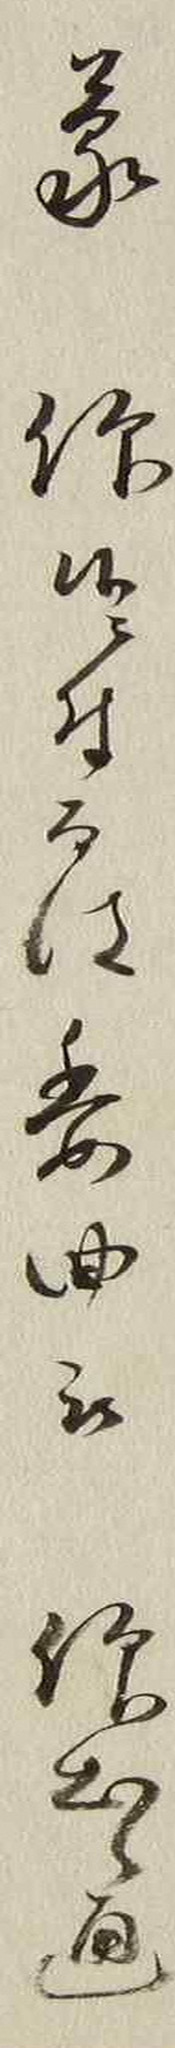蒙仰付候に付而は委曲被仰出候通
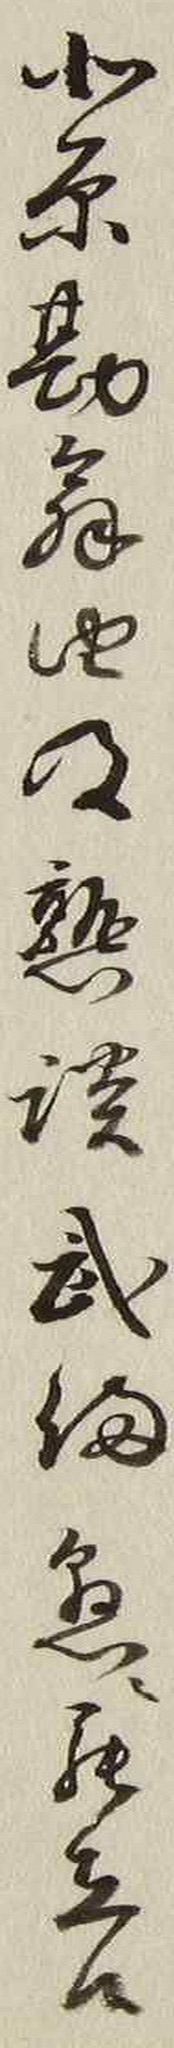北原勘解由及熟談武備懸に罷在候
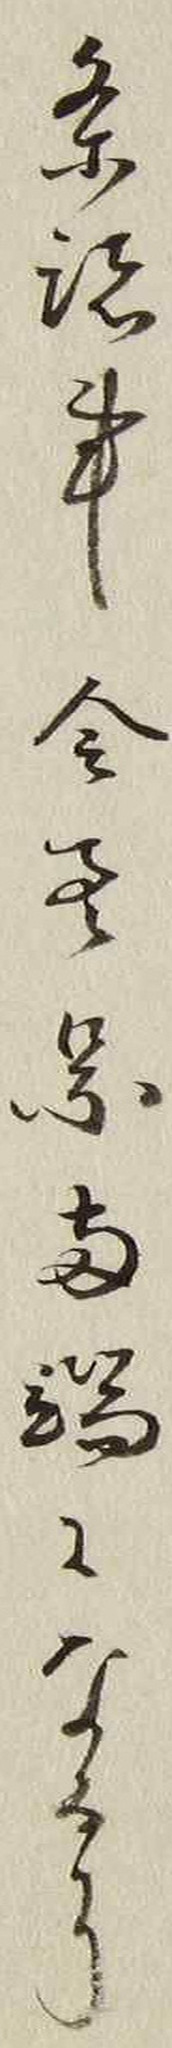条諸事令有図両端になるに
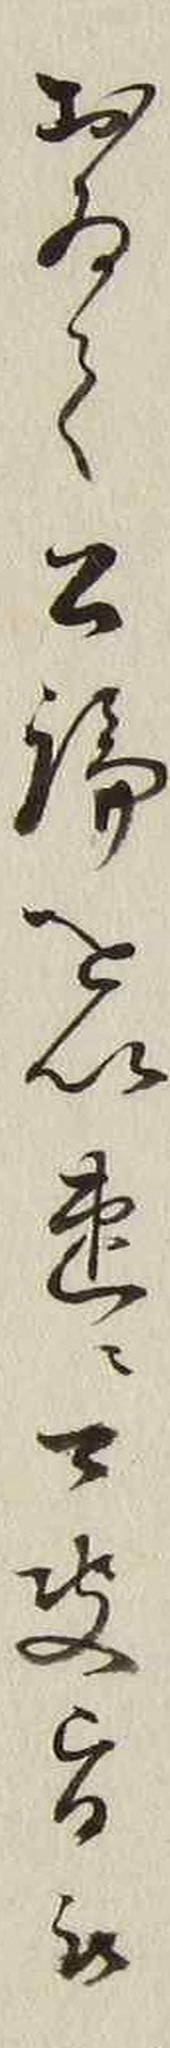おゐて公論を以速に可決旨被
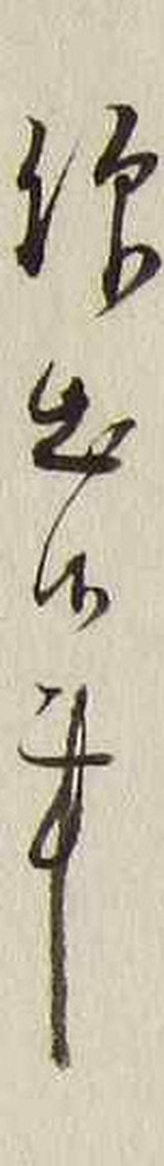仰出候事
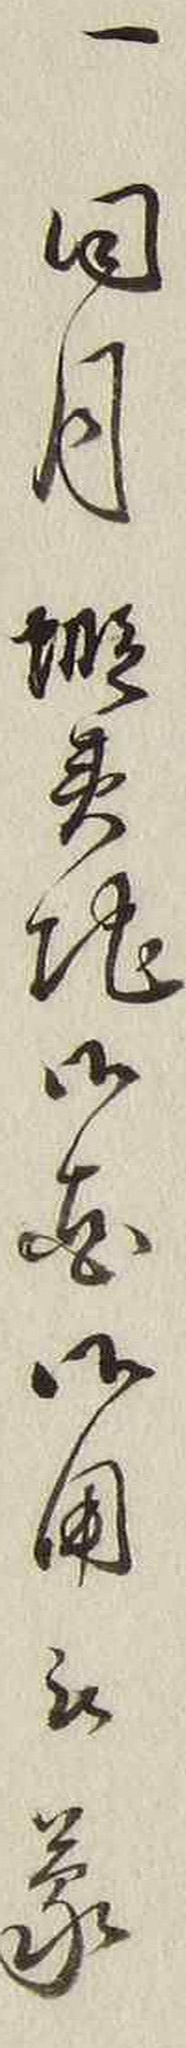一同月蝦夷地御国御用被蒙
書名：諸士系譜　巻之159　な之部1
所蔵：会津若松市立会津図書館
